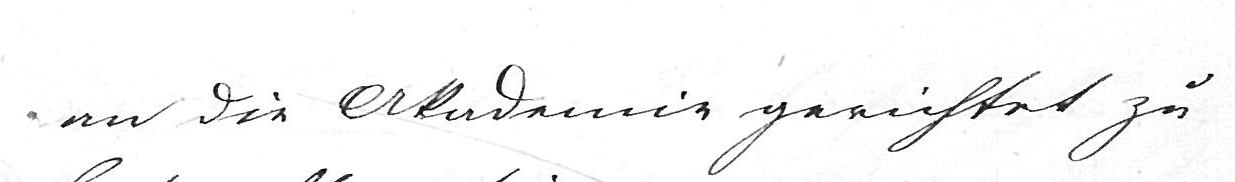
an die Akademie gerichtet zu
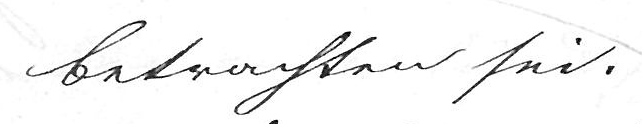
betrachten sei.
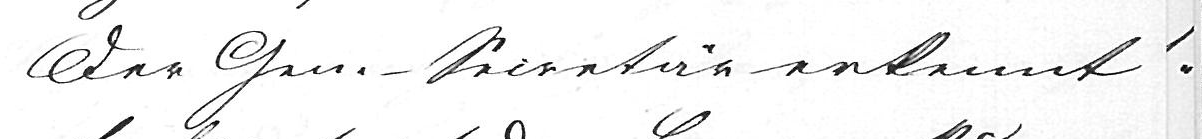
Der Gen.-Secretär erkennt
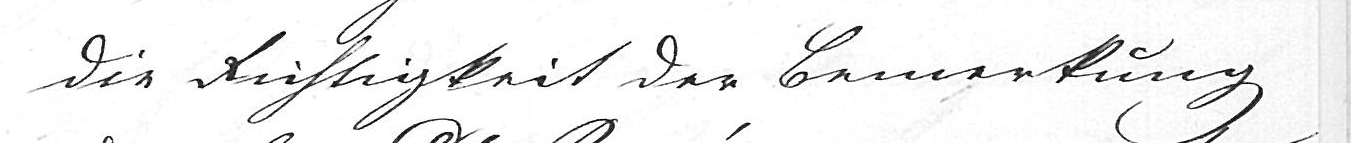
die Richtigkeit der Bemerkung
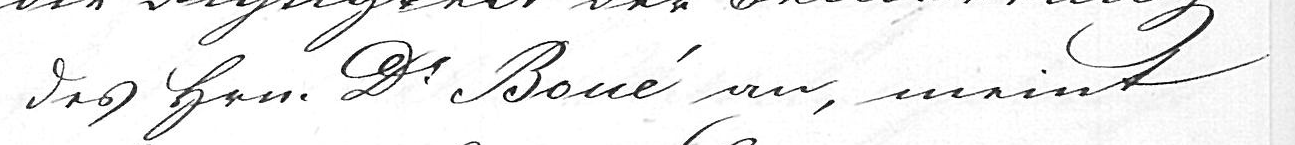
des Hrn. Dr Boué an, meint
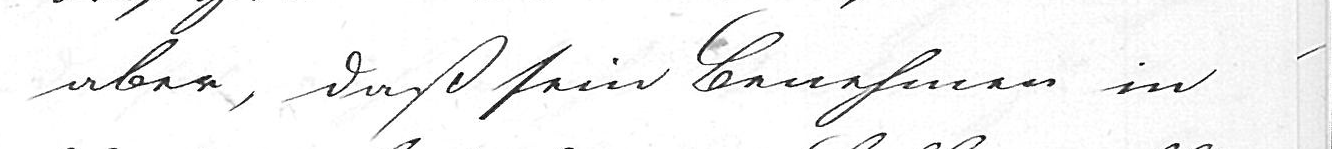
aber, daß sein Benehmen in
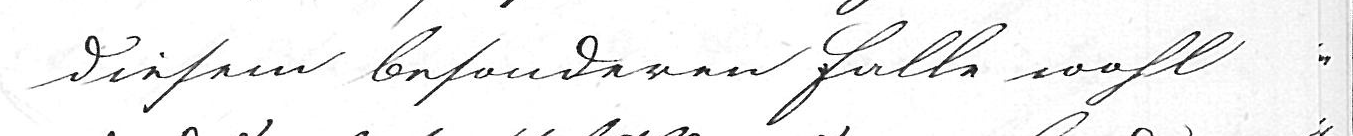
diesem besonderen Falle wohl
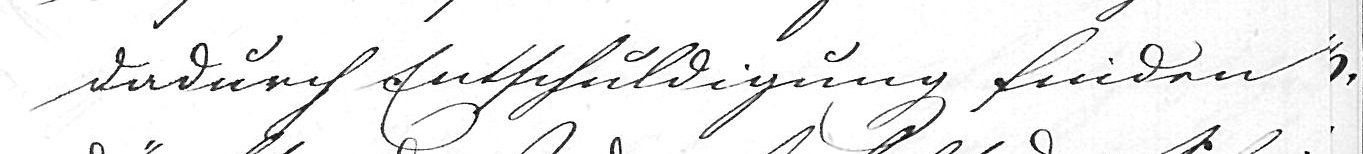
dadurch Entschuldigung finden
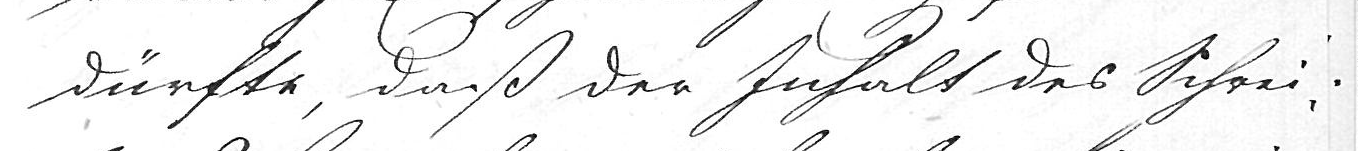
dürfte, daß der Inhalt des Schrei-
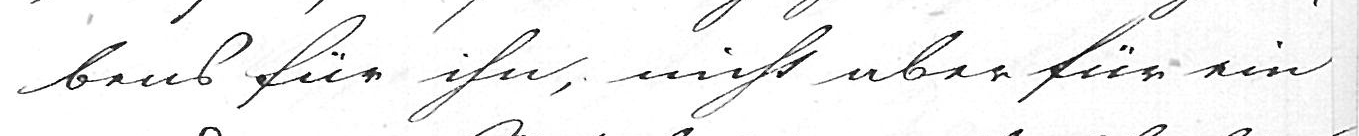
bens für ihn, nicht aber für ein
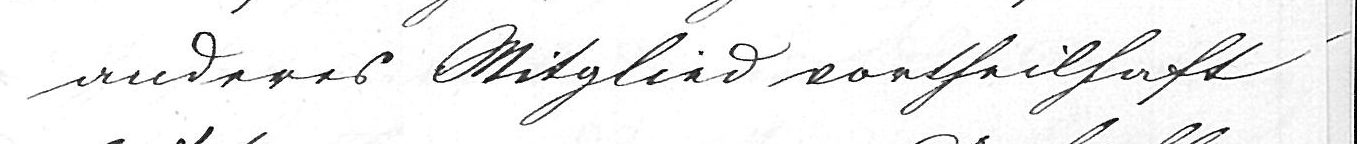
anderes Mitglied vortheilhaft
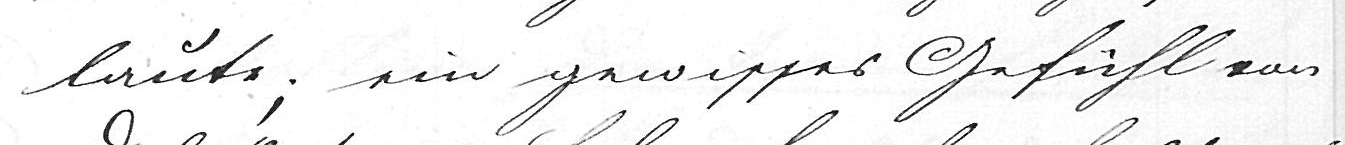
laute; ein gewisses Gefühl von
